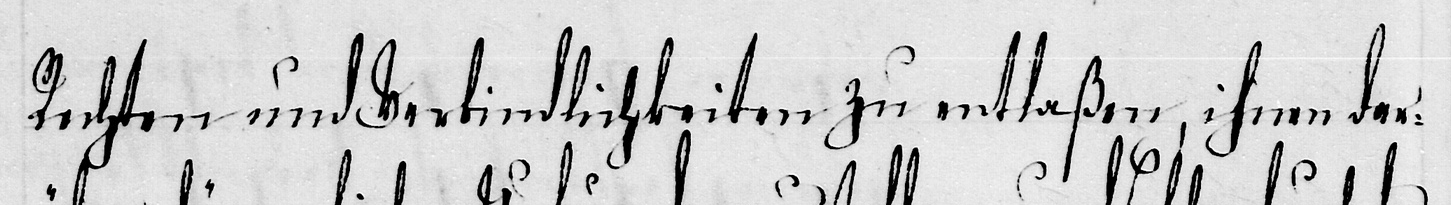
Rechten und Verbindlichkeiten zu entlaßen, ihnen da¬
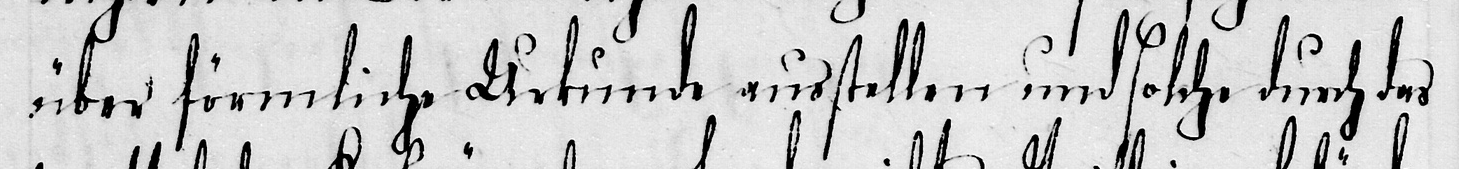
rüber förmliche Urkunde ausstellen und solche
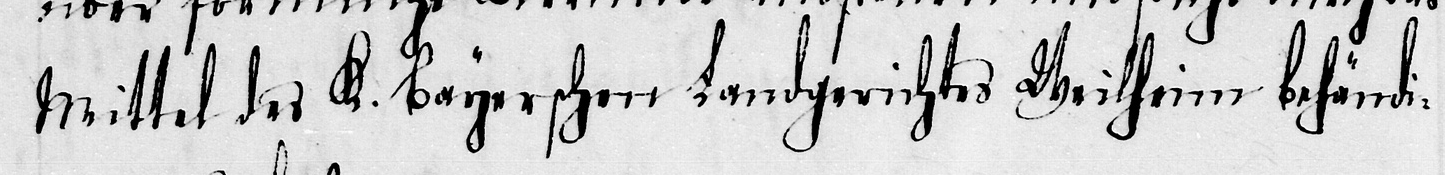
Mittel des K. Bayerschen Landgerichtes Weilheim behänd¬
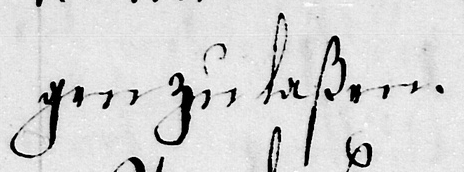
igen zu laßen.
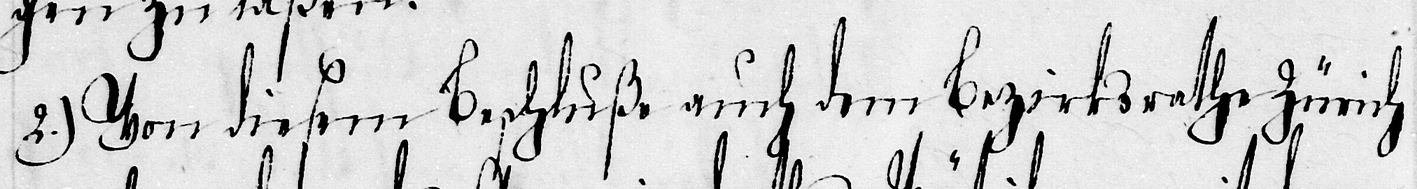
2.) Von diesem Beschluße auch dem Bezirksrathe Zürich
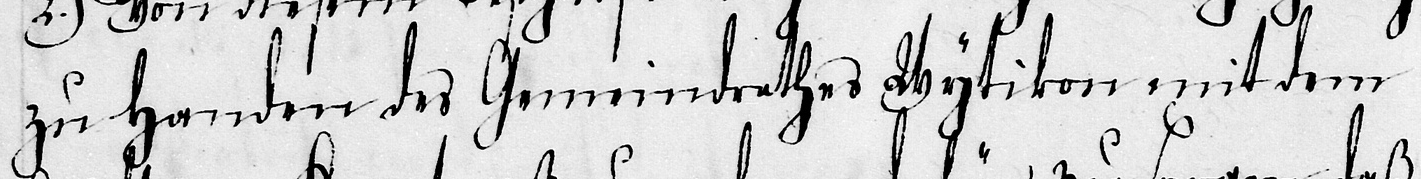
zu Handen des Gemeindrathes Wytikon mit dem
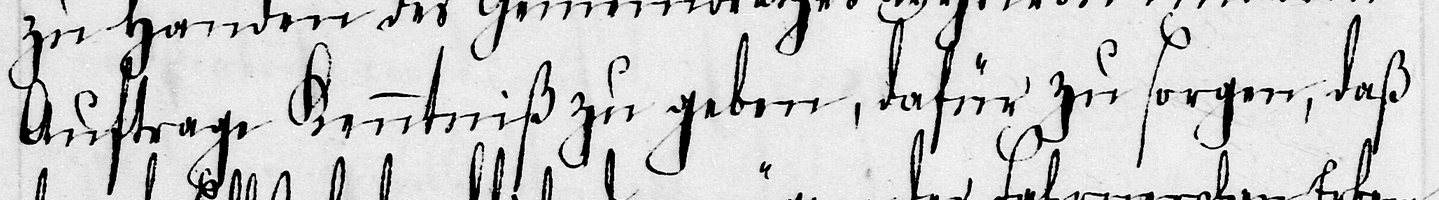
Auftrage Kenntniß zu geben, dafür zu sorgen, daß
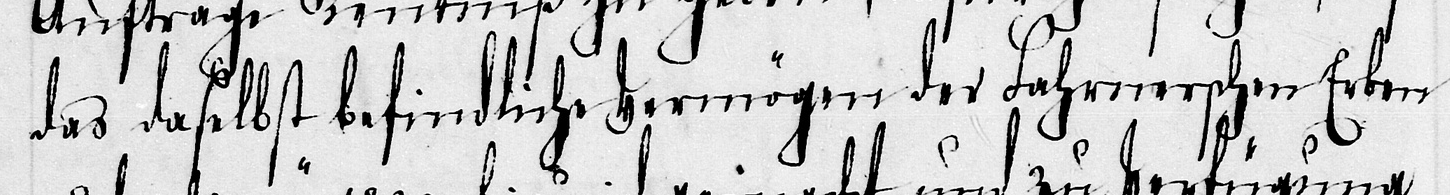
daselbst befindliche Vermögen der Fahrnerschen
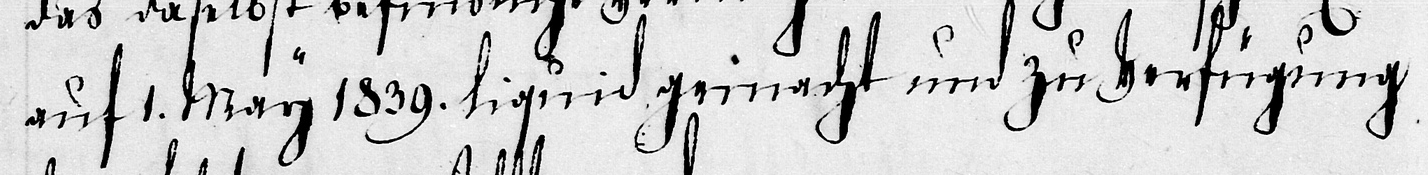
auf 1. May 1839. liquid gemacht und zu Verfügung
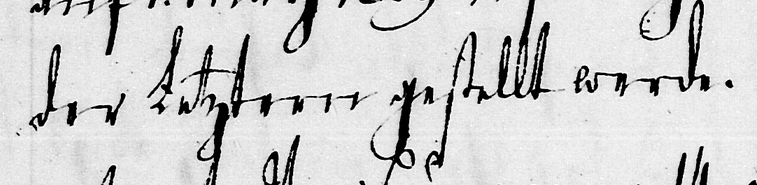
der Letztern gestellt werde.
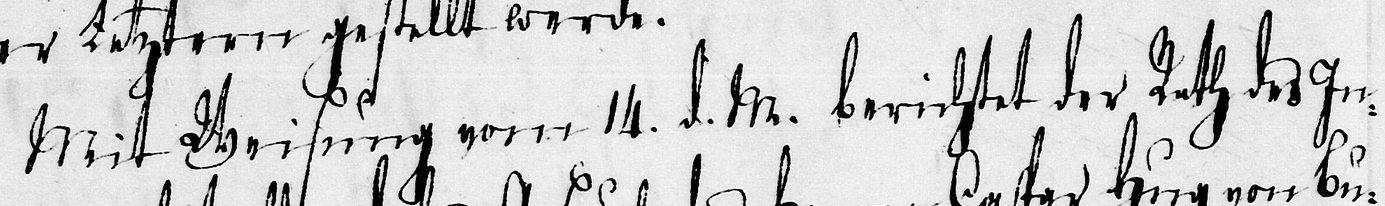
Mit Weisung vom 14. d. M. berichtet der Rath des In¬
